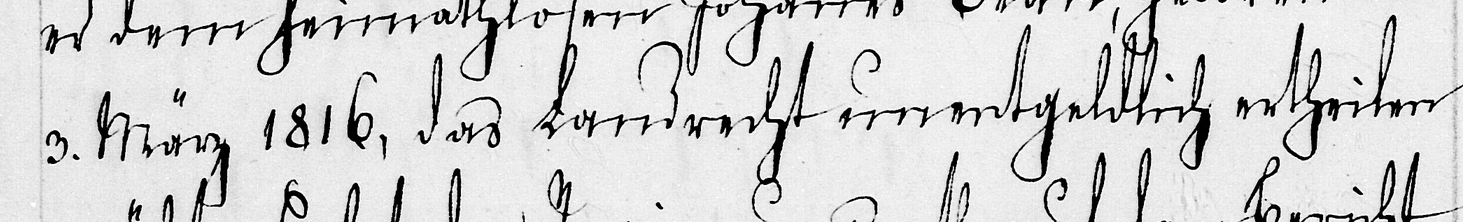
3. März 1816, das Landrecht unentgeldlich ertheilen
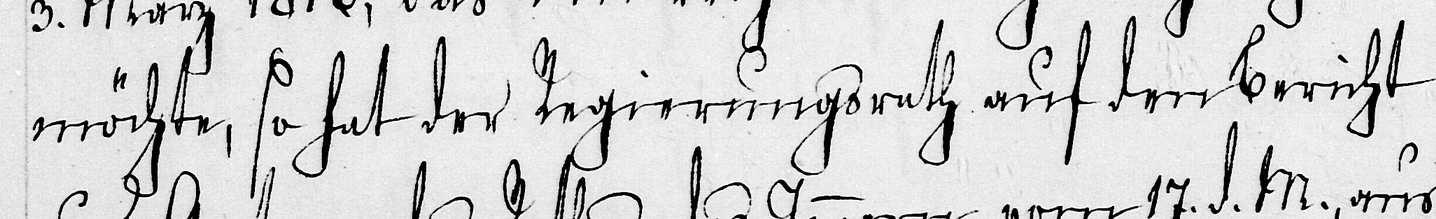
möchte, so hat der Regierungsrath auf den Bericht
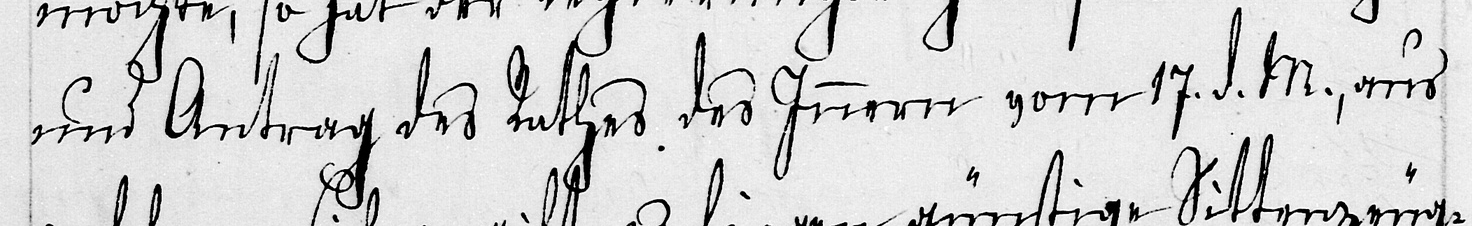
und Antrag des Rathes des Innern vom 17. d. M., aus
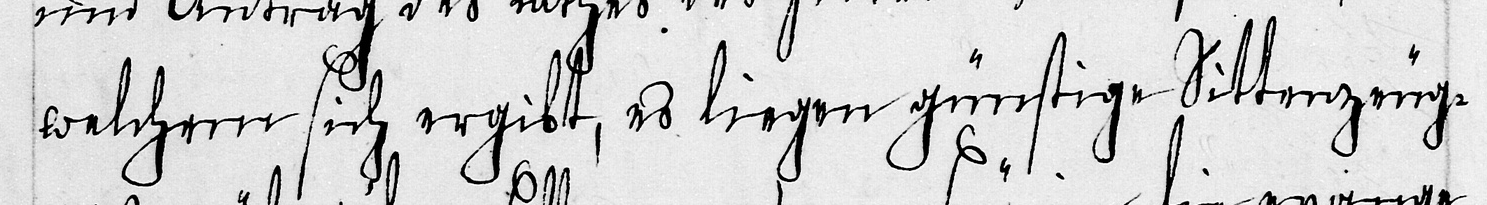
welchem sich ergibt, es liegen günstige Sittenzeug¬
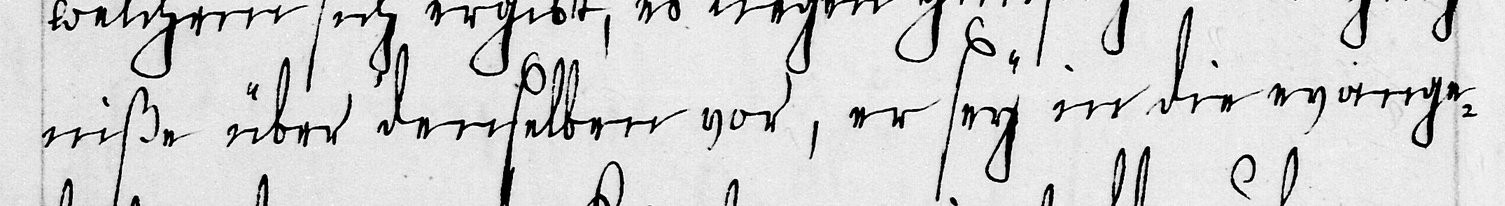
niße über denselben vor, er sey in die evange¬
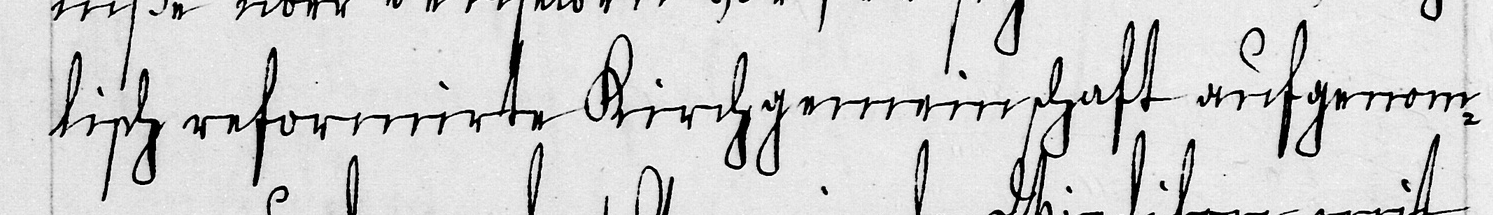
lisch reformirte Kirchgemeinschaft aufgenom¬
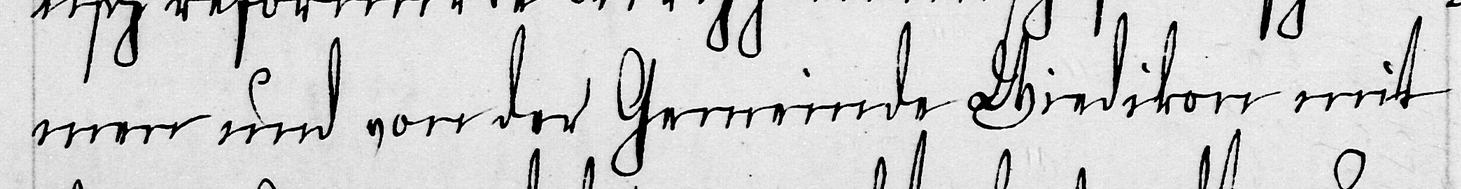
men und von der Gemeinde Wiedikon mit
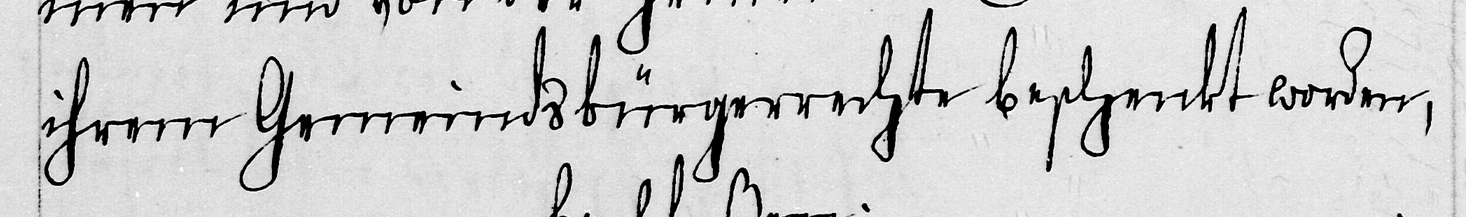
ihrem Gemeindsbürgerrechte beschenkt worden,
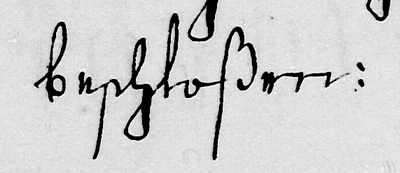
beschloßen:
